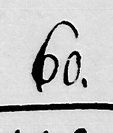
60.
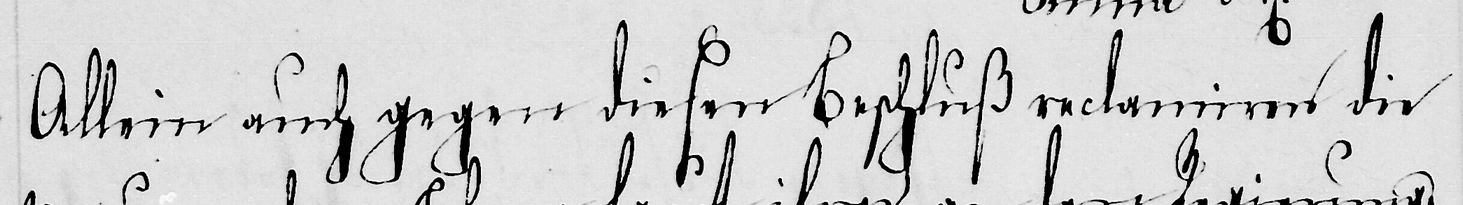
Allein auch gegen diesen Beschluß reclamiren die
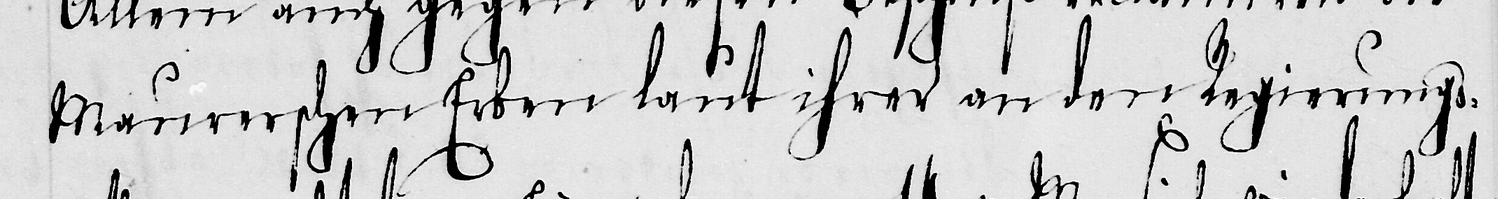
Maurerschen Erben laut ihrer an den Regierungs¬
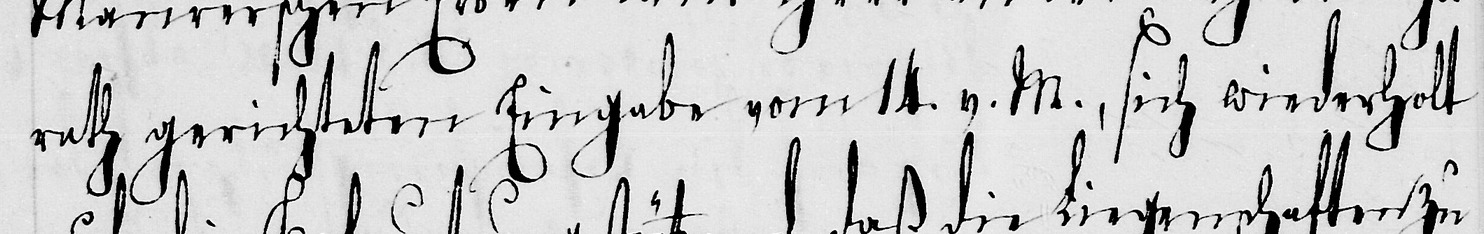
rath gerichteteten Eingabe vom 14. v. M., sich wiederholt
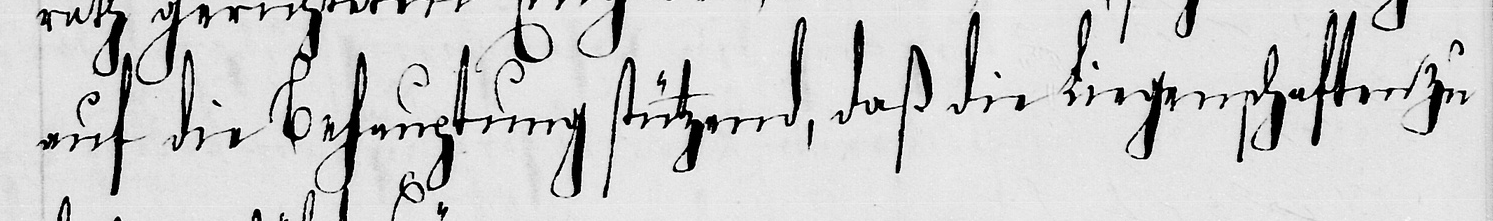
auf die Behauptung stützend, daß die Liegenschaften zu
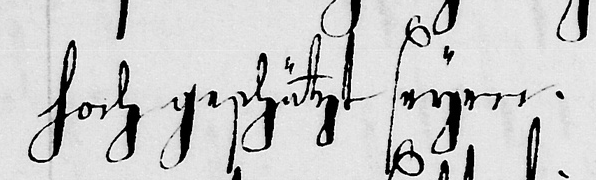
hoch geschätzt seyen.
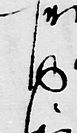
sü¬
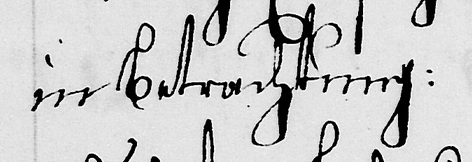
in Betrachtung:
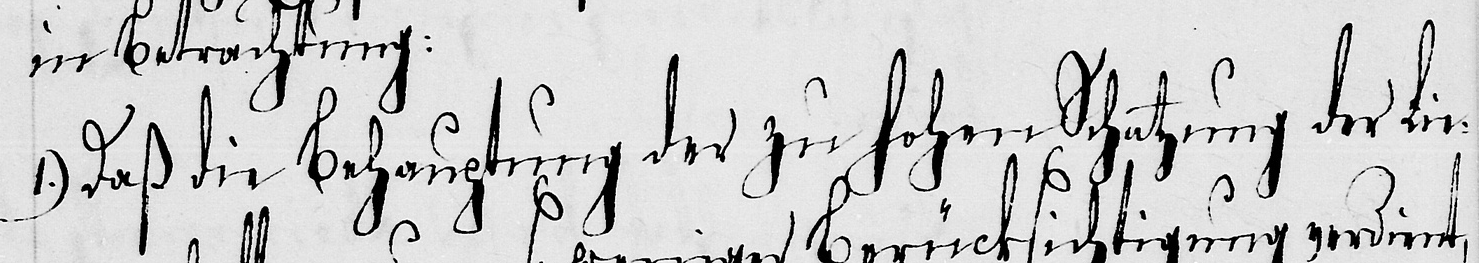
Daß die Behauptung der zu hohen Schätzung der Li¬
